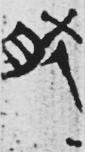肰（然）
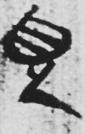見
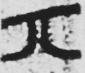亓（其）
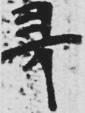𡵂（美）
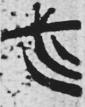必
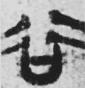谷（欲）
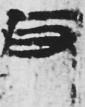反（返）
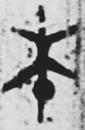本
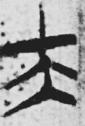夫
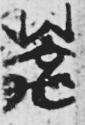○（葛）
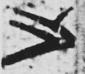之
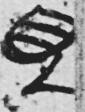見
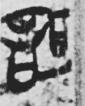訶（歌）
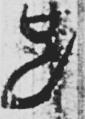也
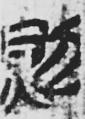則（則）
